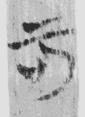可
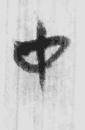中
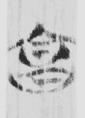合
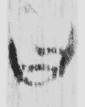曰
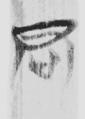君
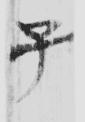子
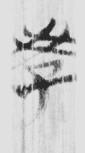𡥈
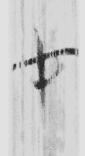才
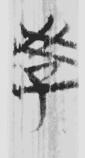𡥈
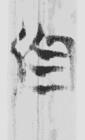於
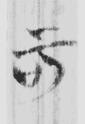可
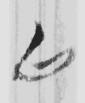㠯（以）
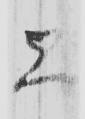巳
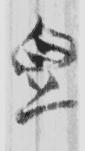見
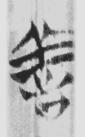善
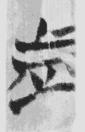者
